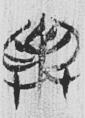與
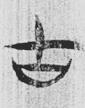古
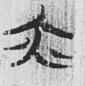亦
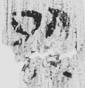○（然）
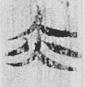亦
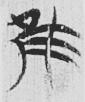隹（唯）
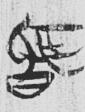○（聞）
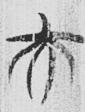夫
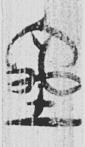○（禹）
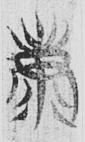康（湯）
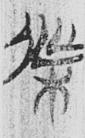傑（桀）
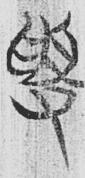受
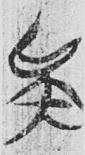矣
